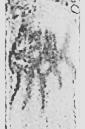穆
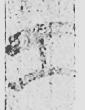王
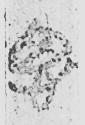思
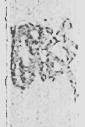毆
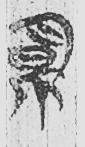{明示}
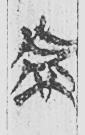者
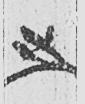之
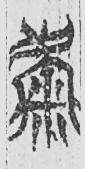麋
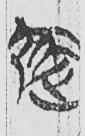{尾少止}
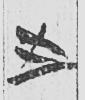之
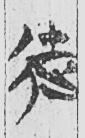徒
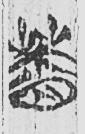{艹㐭}
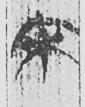宋
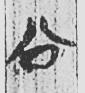公
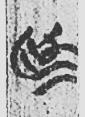爲
